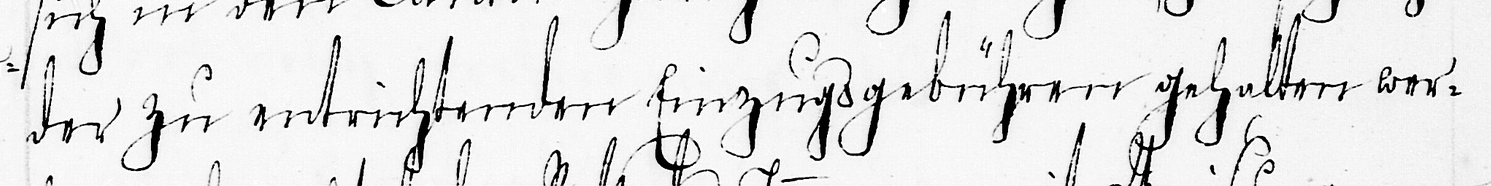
der zu entrichtenden Einzugsgebühren gehalten wer¬
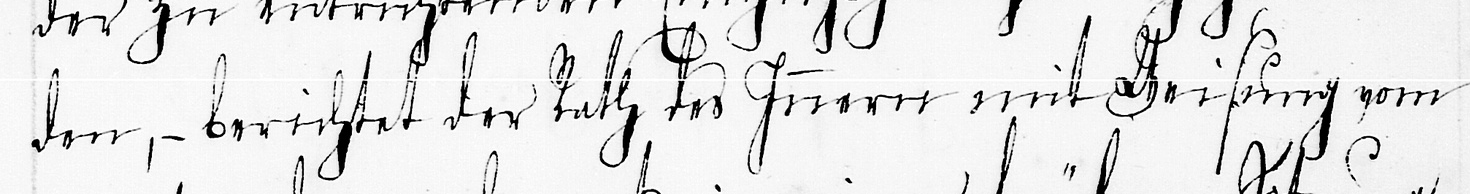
den, – berichtet der Rath des Innern mit Weisung vom
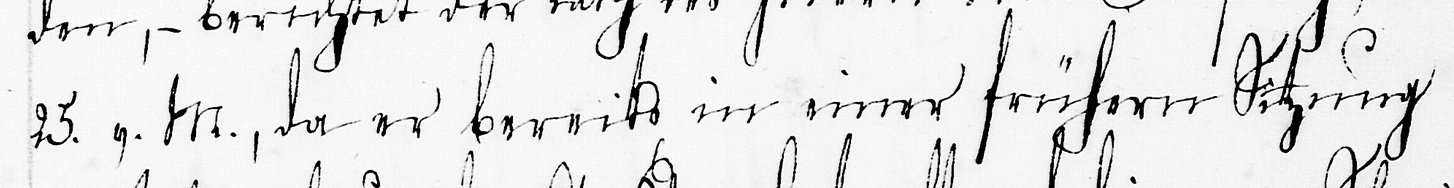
25. v. M., da er bereits in einer frühern Sitzung
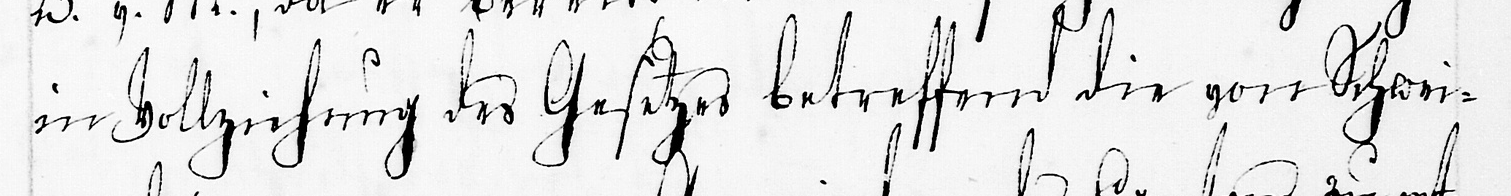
in Vollziehung des Gesetzes betreffend die von Schwei¬
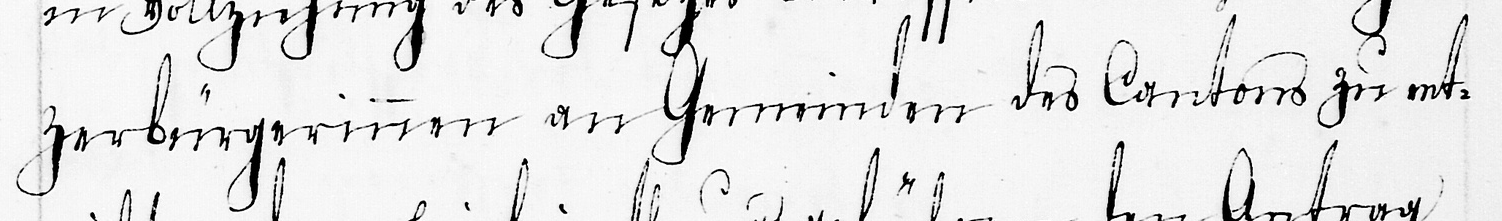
zerbürgerinnen an Gemeinden des Cantons zu ent¬
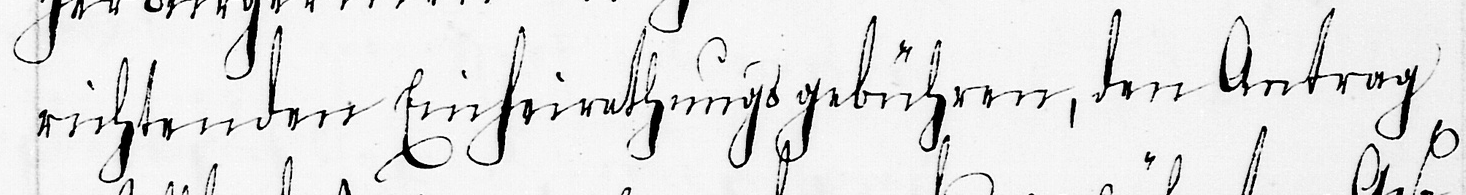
richtenden Einheirathungsgebühren, den Antrag
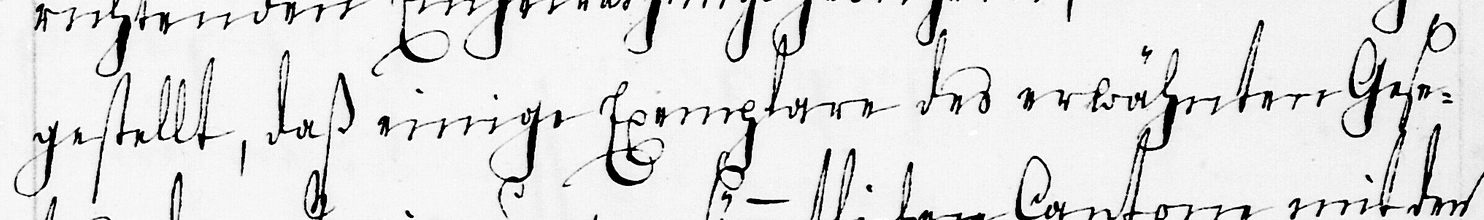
gestellt, daß einige Exemplare des erwähnten Gese¬
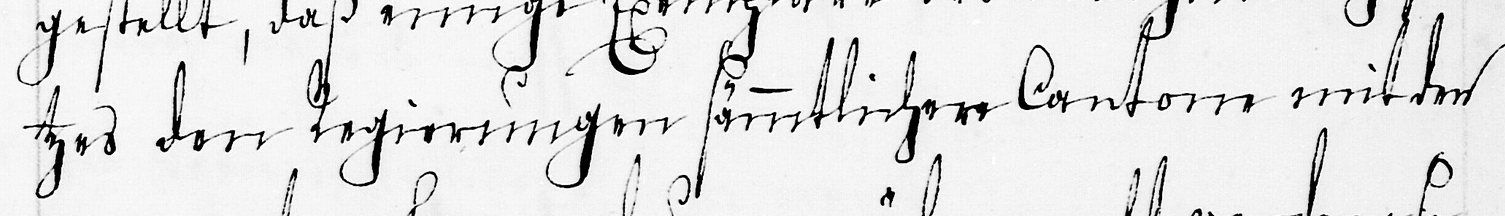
tzes den Regierungen sämmtlicher Cantone mit den
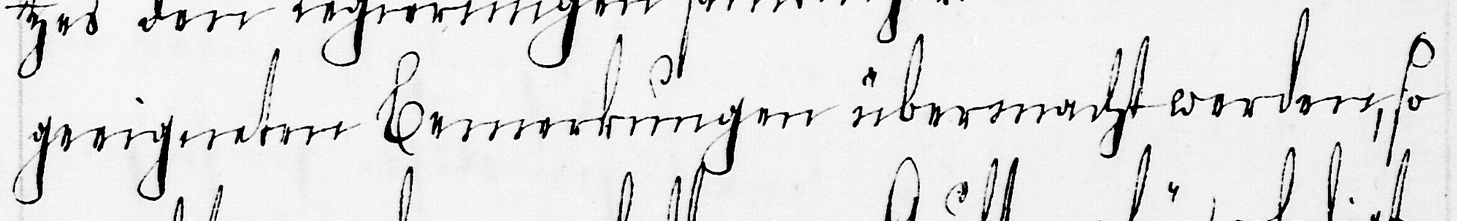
geeigneten Bemerkungen übermacht werden, so
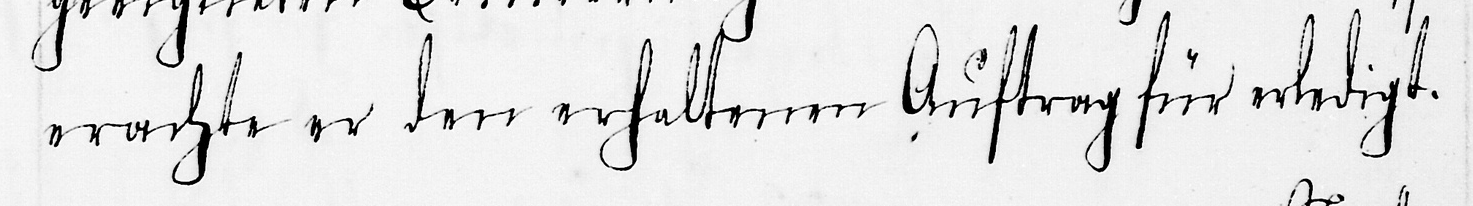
erachte er den erhaltenen Auftrag für erledigt.
